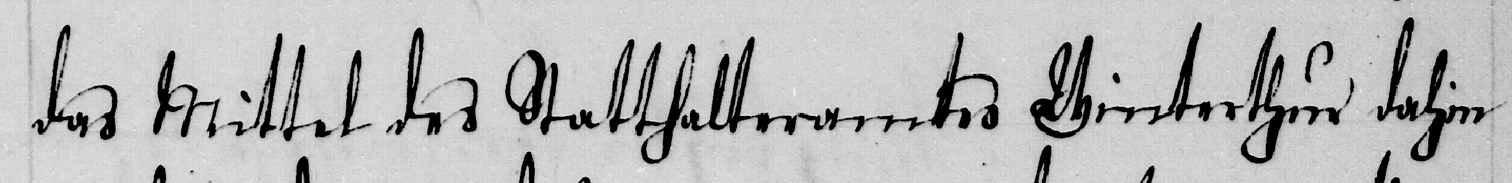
das Mittel des Statthalteramtes Winterthur dahin
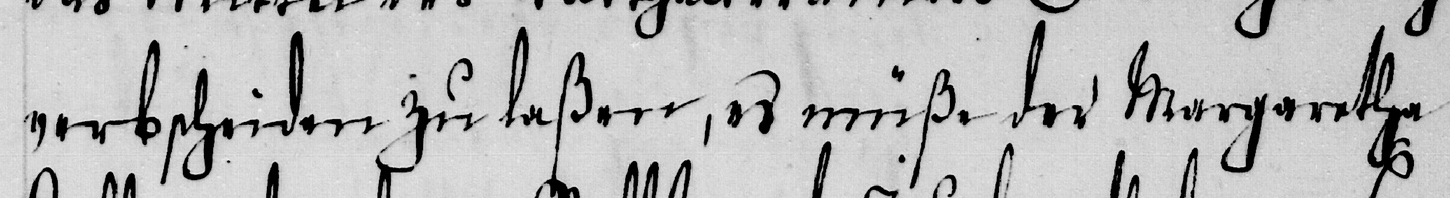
verbscheiden zu laßen, es müße der Margaretha
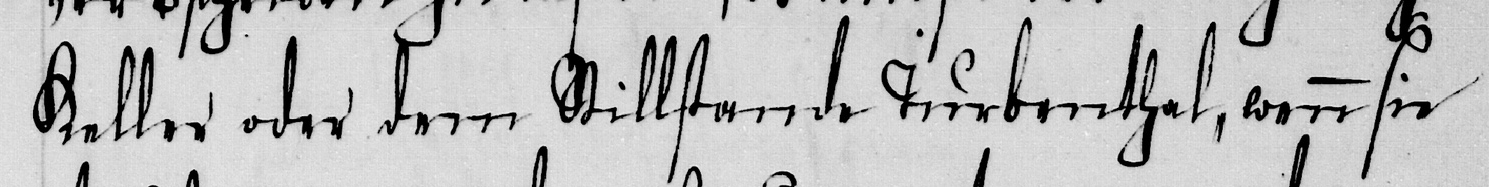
Keller oder dem Stillstande Turbenthal, wenn sie
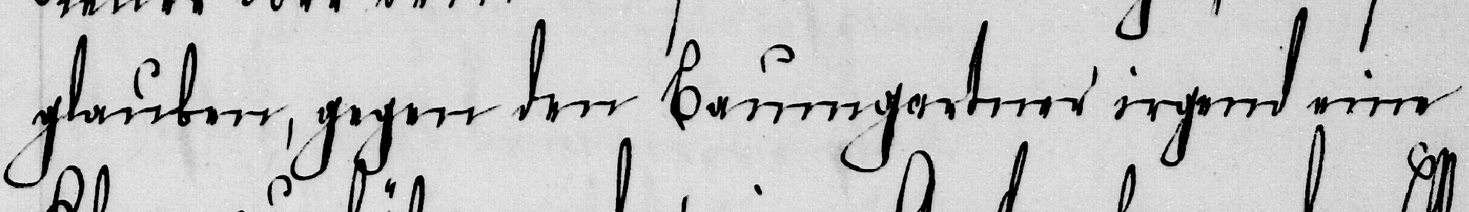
glauben, gegen den Baumgartner irgend eine
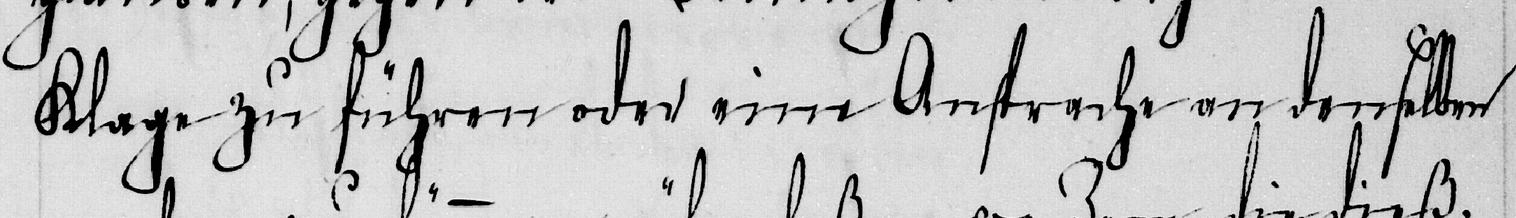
Klage zu führen oder eine Ansprache an denselben
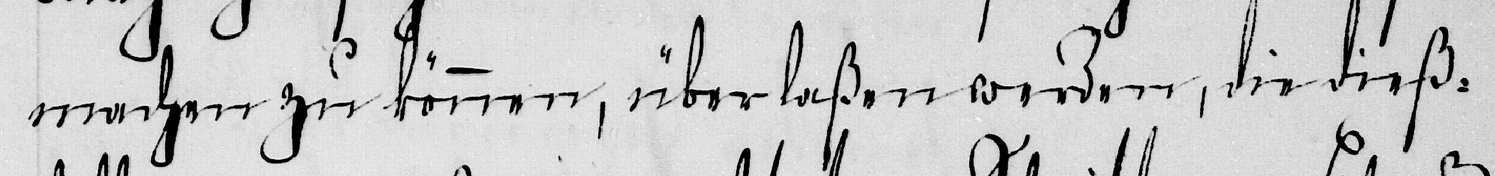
machen zu können, überlaßen werden, die dieß¬
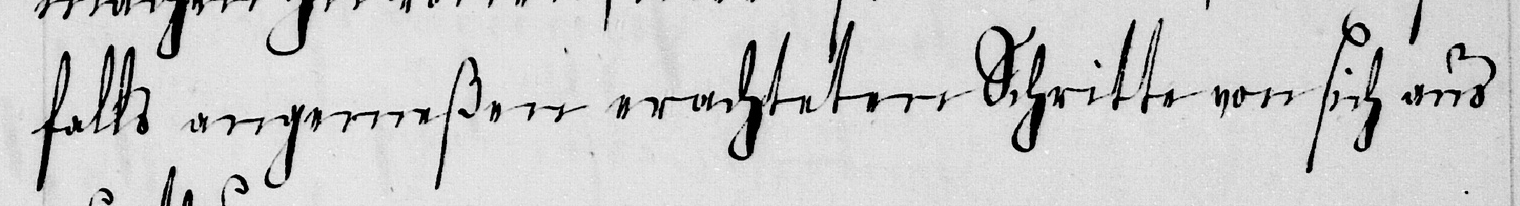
falls angemeßen erachteten Schritte von sich aus
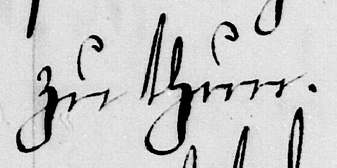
zu thun.
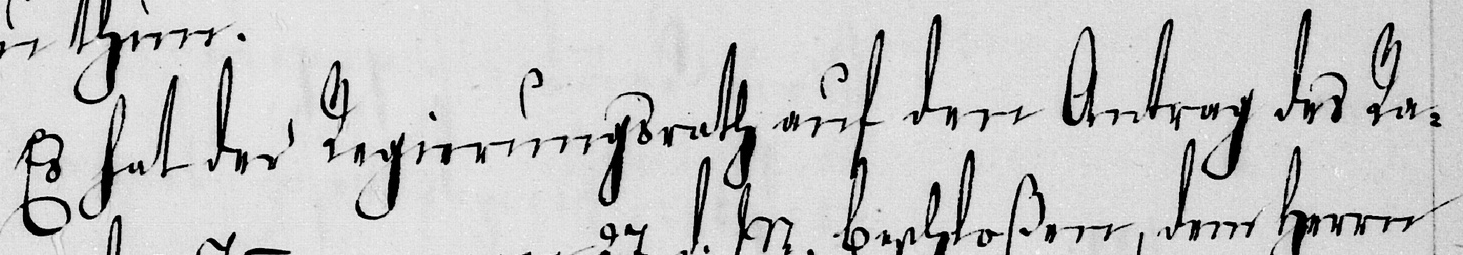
s hat der Regierungsrath, auf den Antrag des Ra¬
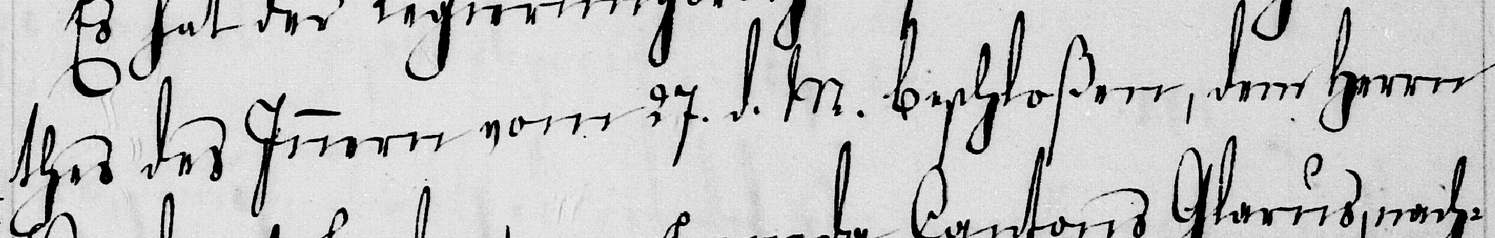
thes des Innern vom 27. d. M. beschloßen, dem Herrn
